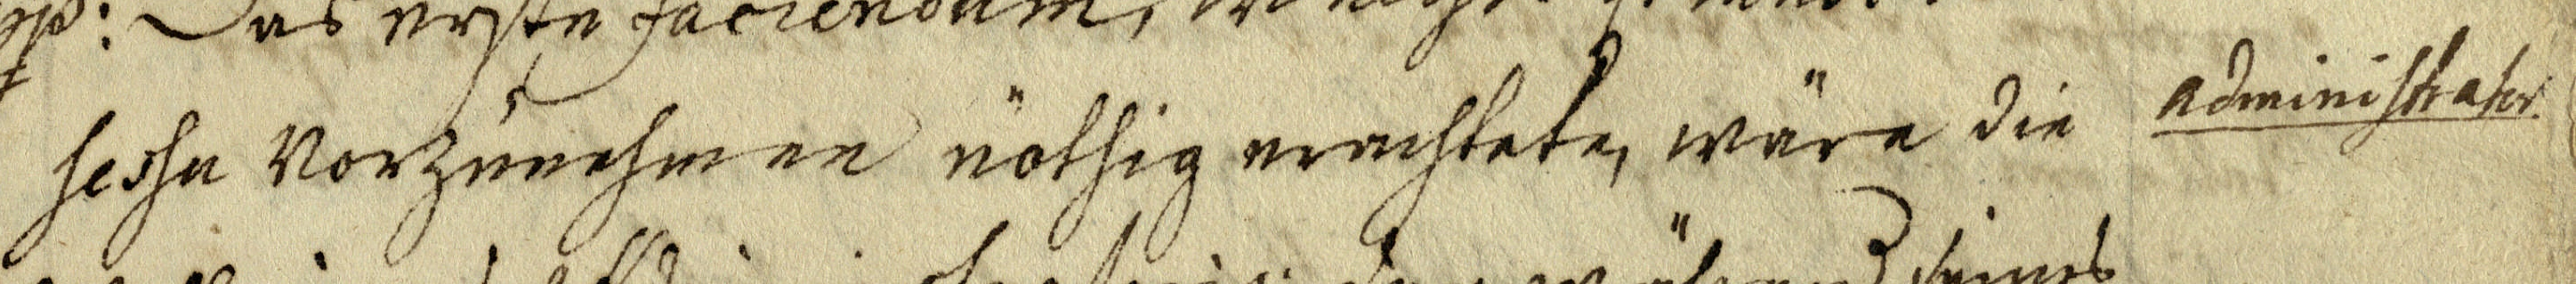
sessu vorzunehmen nöthig erachtete, wäre die
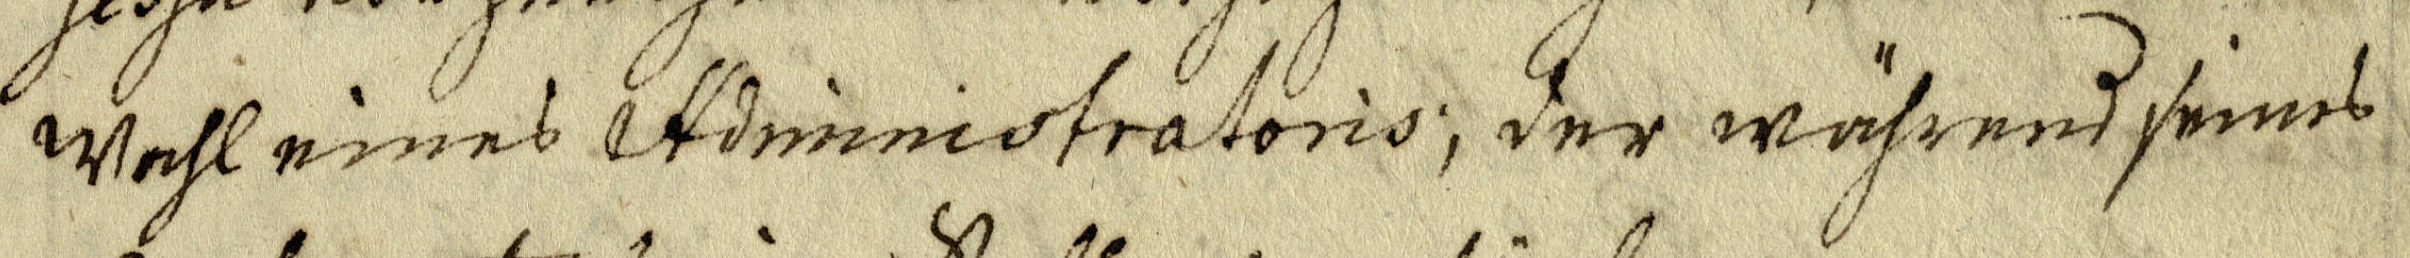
Wahl eines Administratoris, der während seines
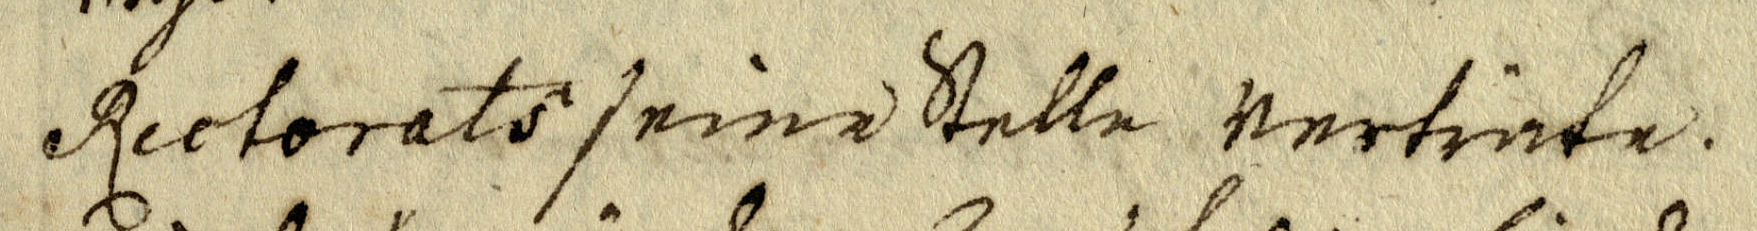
Rectorats seine Stelle verträte.
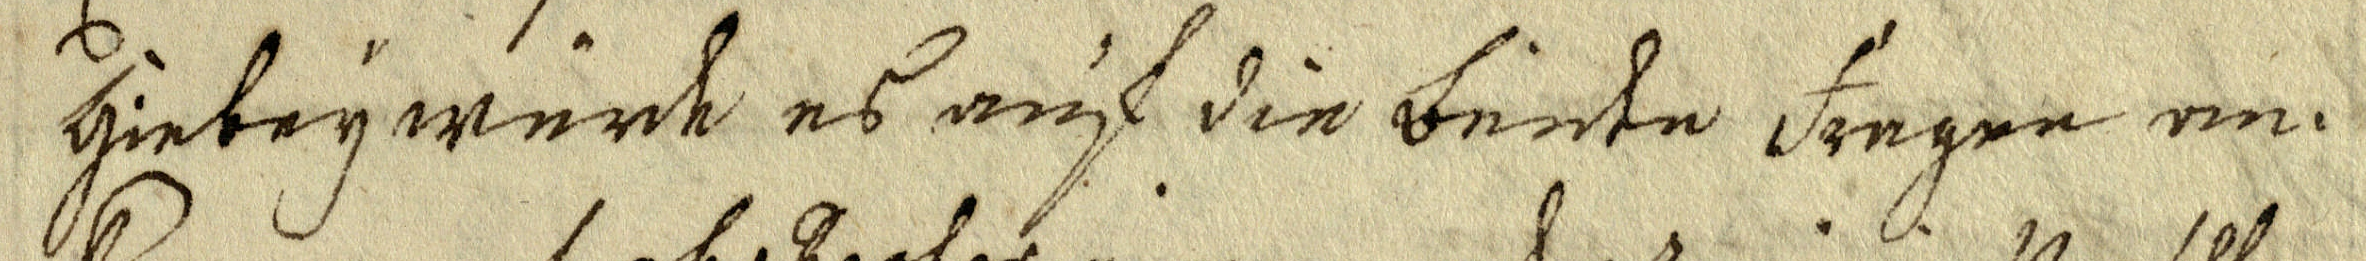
Hiebeÿ würde es auf die beiden Fragen an¬
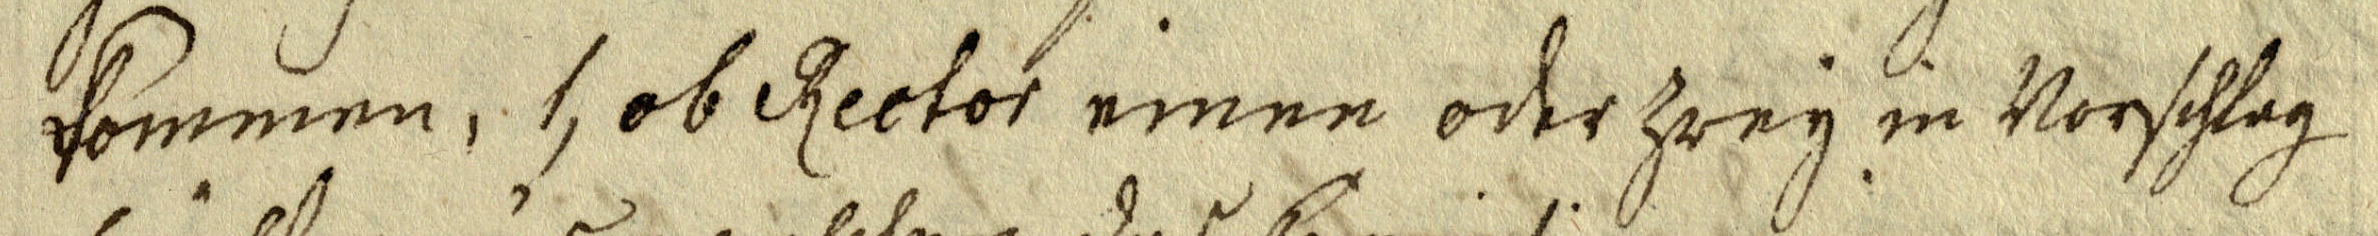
kommen, 1, ob Rector einen oder zweÿ in Vorschlag
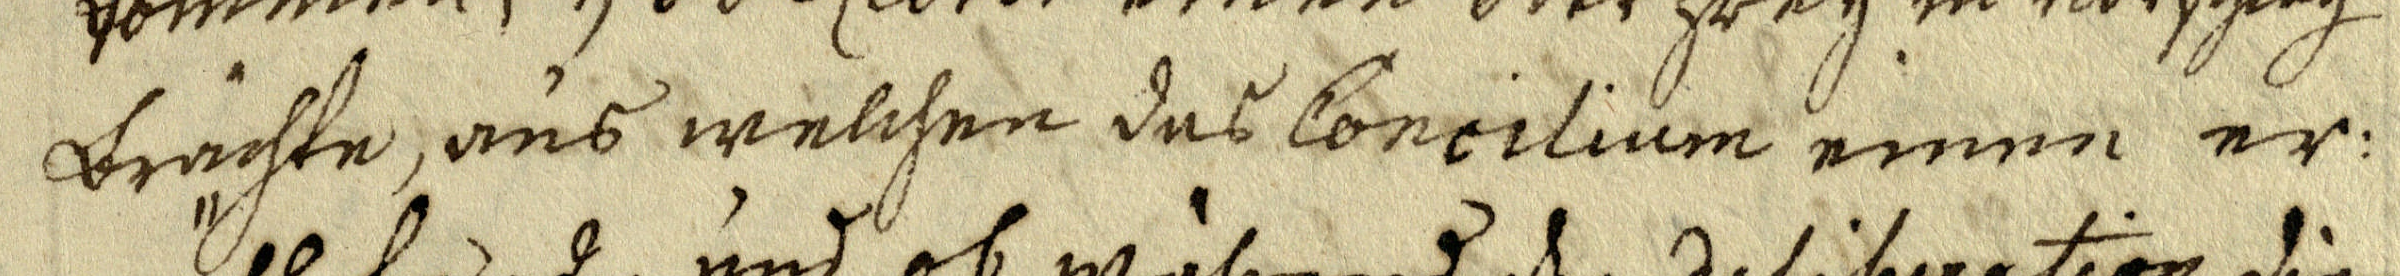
brächte, aus welchen das Concilium einen er¬
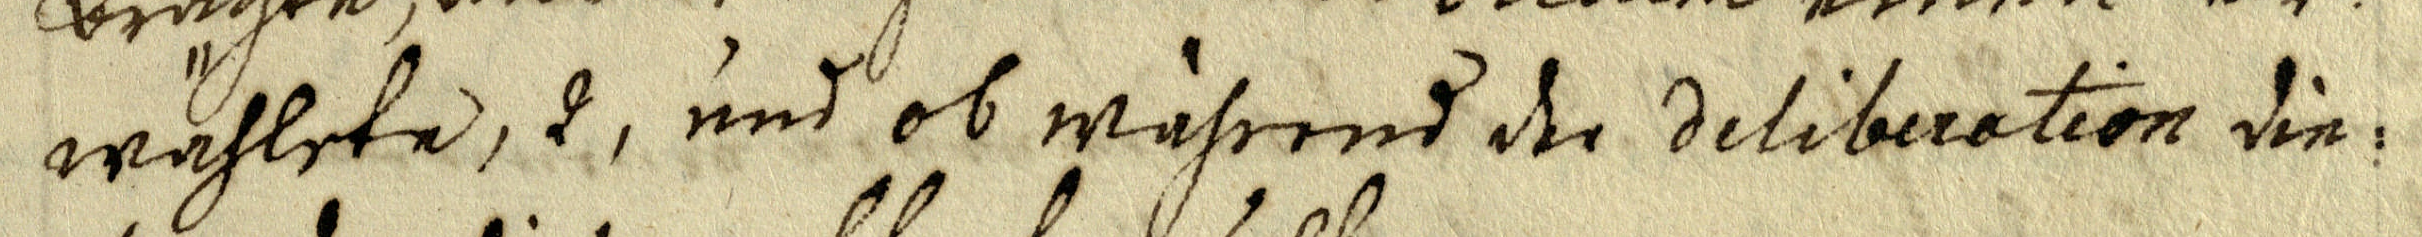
wählete, 2, und ob während der deliberation die¬
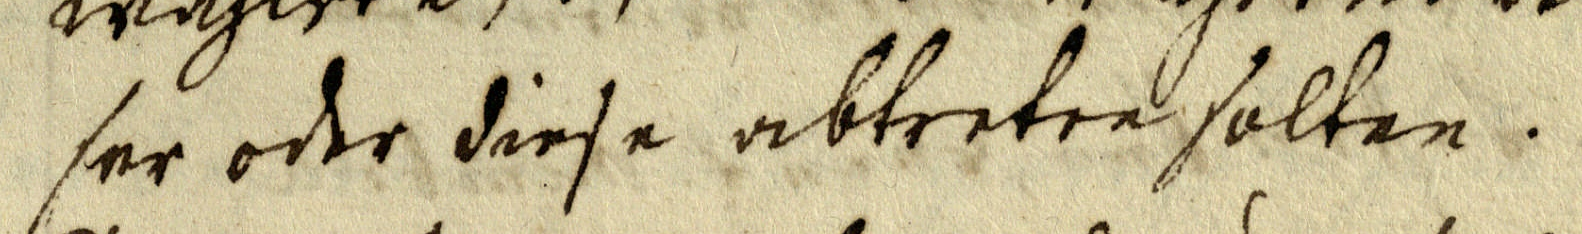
ser oder diese abtreten solten.
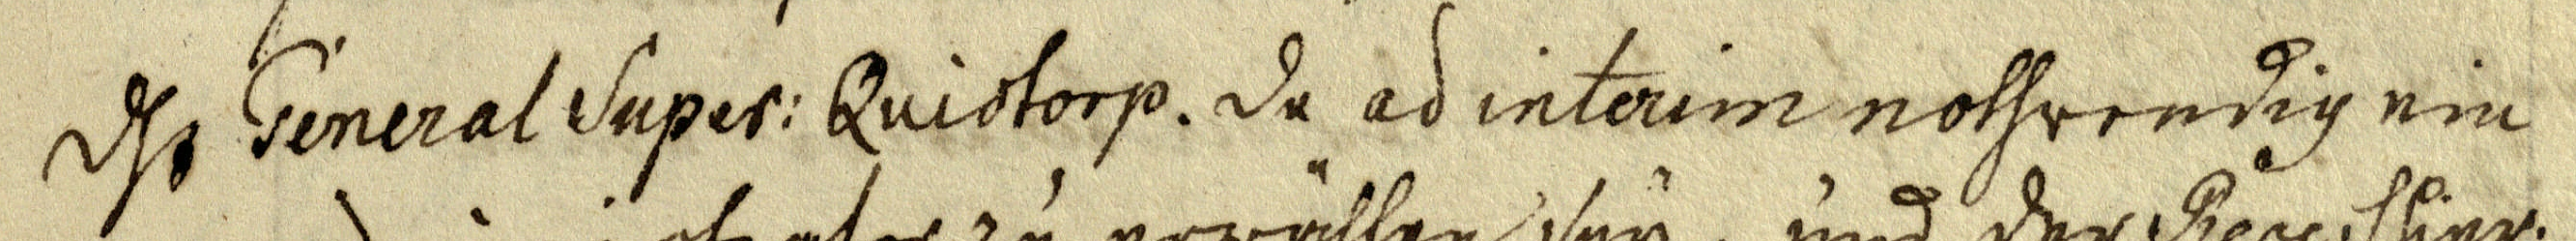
dh General Super: Quistorp . Da ad interim nothwendig ein
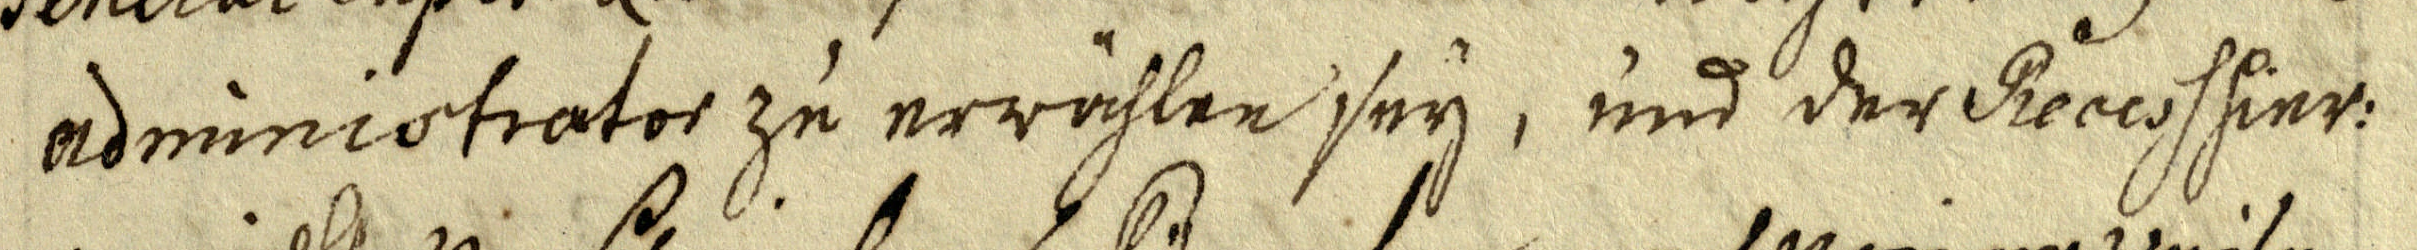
administrator zu erwählen seÿ, und der Recess hier¬
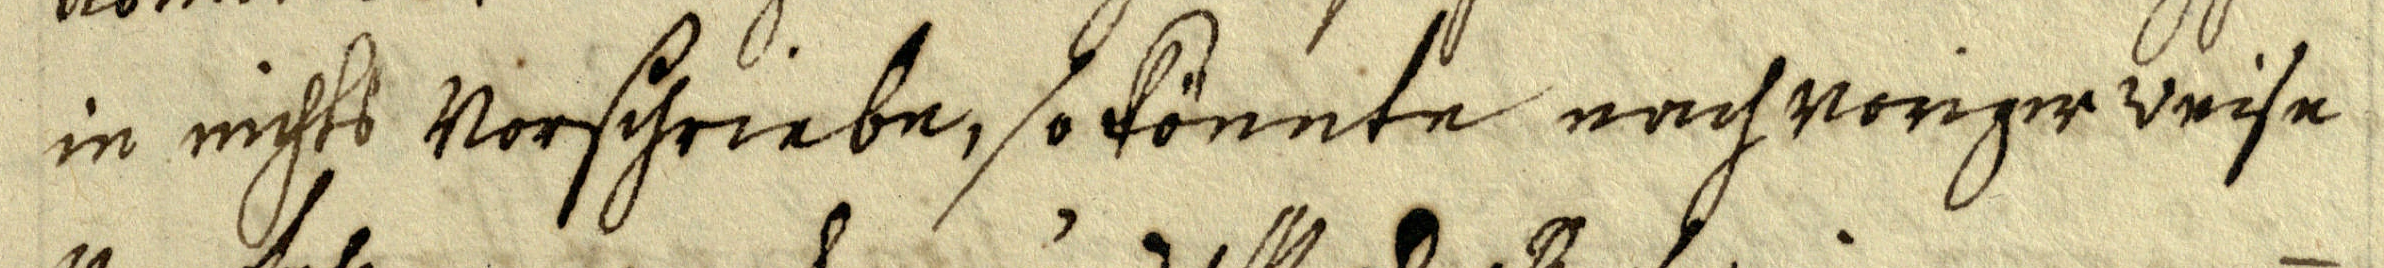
in nichts vorschriebe, so könnte nach voriger weise
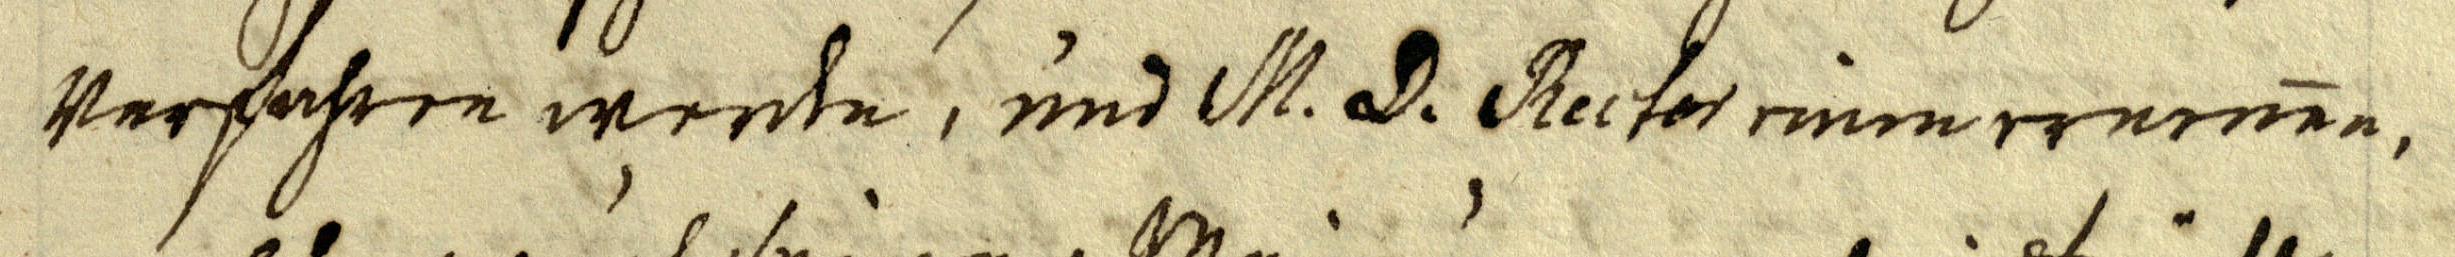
verfahren werden, und M. D. Rector einen ernenen,
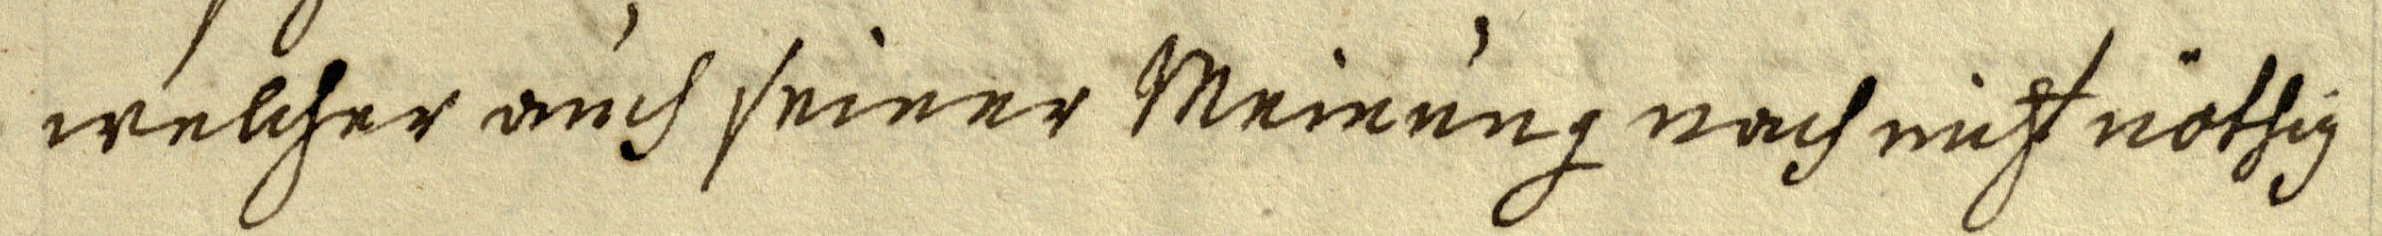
welcher auch seiner Meinung nach nicht nöthig
